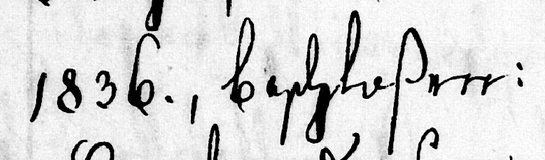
1836., beschloßen:
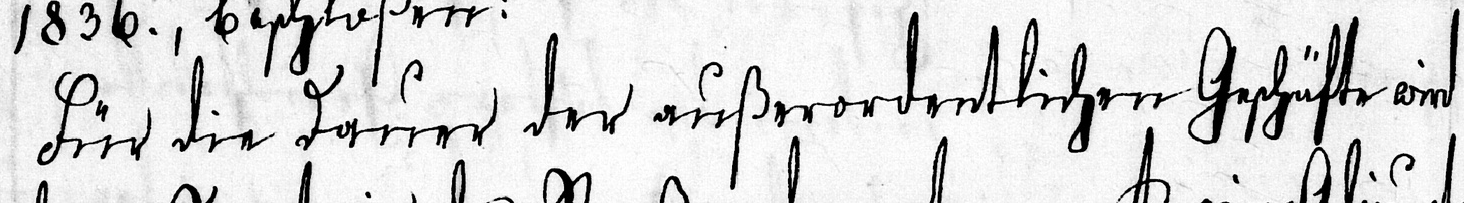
Für die Dauer der außerordentlichen Geschäfte
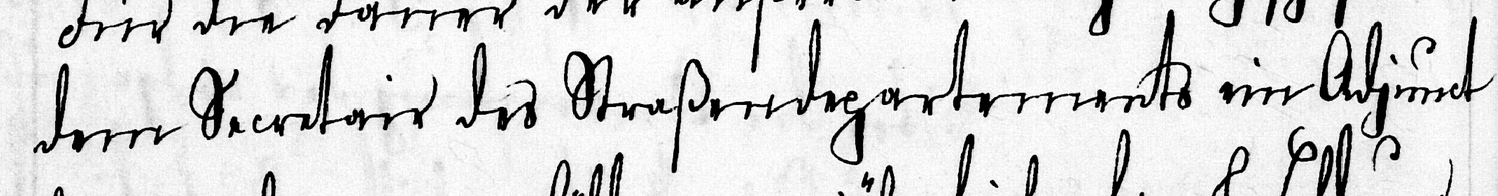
dem Secretair des Straßendepartements ein Adjunct
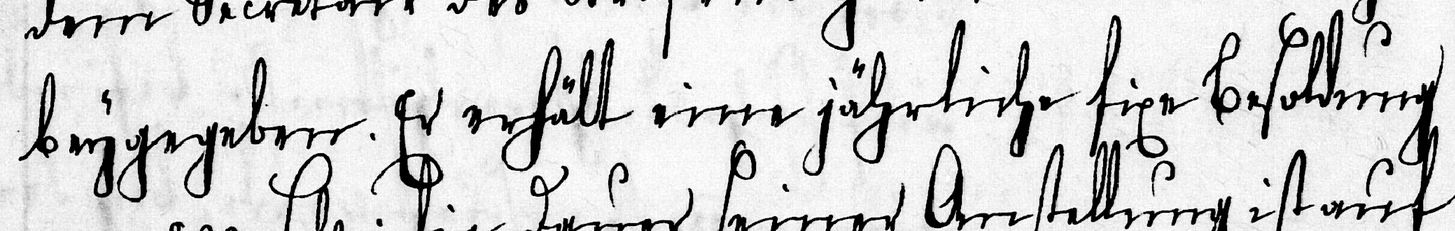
beygegeben. Er erhält eine jährliche fixe Besoldung
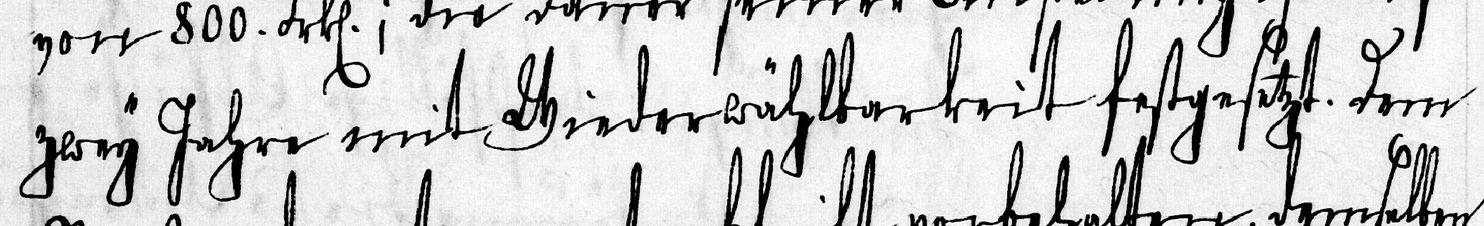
zwey Jahre mit Wiederwählbarkeit festgesetzt. Dem
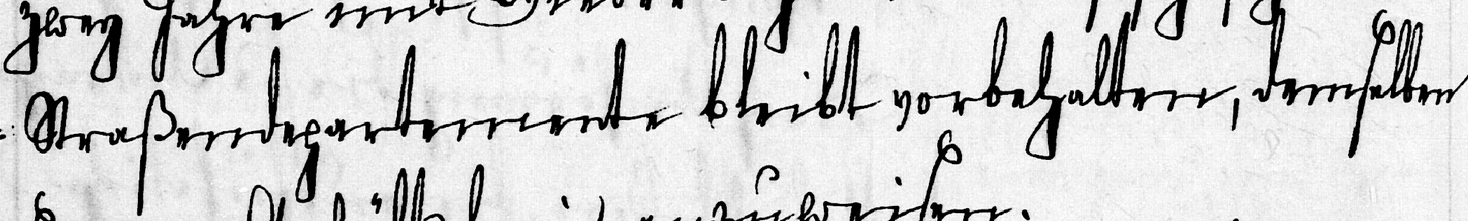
Straßendepartemente bleibt vorbehalten, demselben
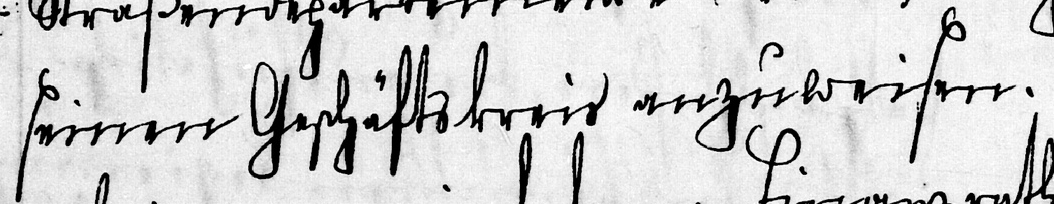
seinen Geschäftskreis anzuweisen.
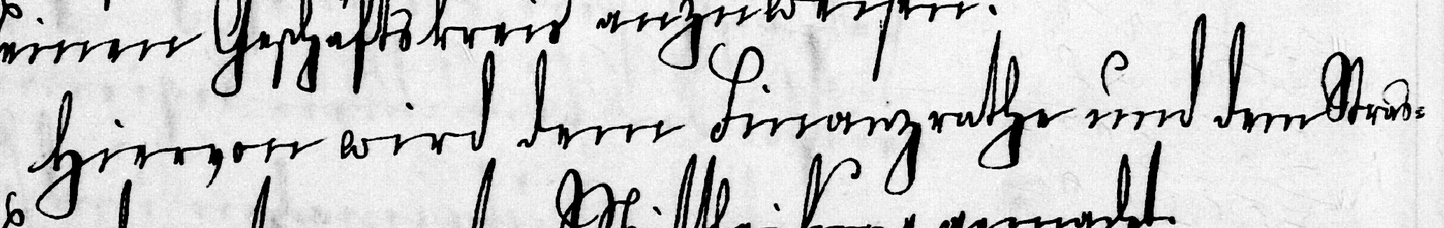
Hiervon wird dem Finanzrathe und dem Straß¬
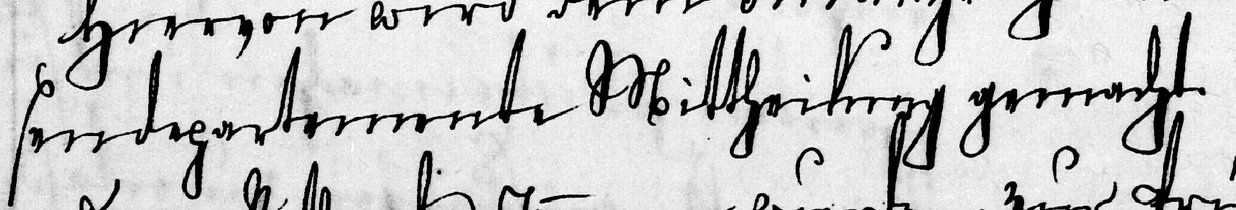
endepartemente Mittheilung gemacht.
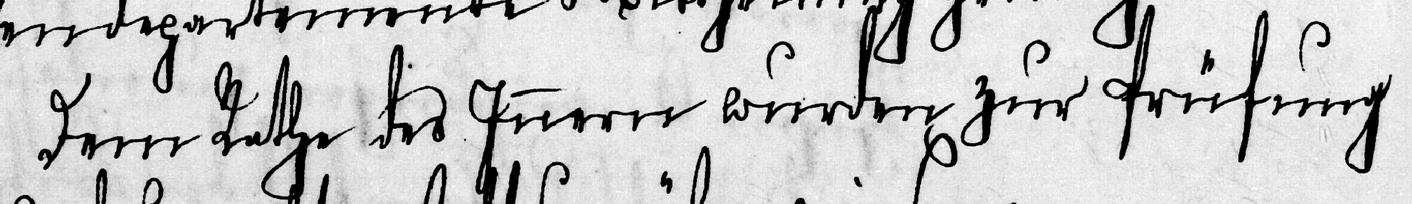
Dem Rathe des Innern wurden zur Prüfung
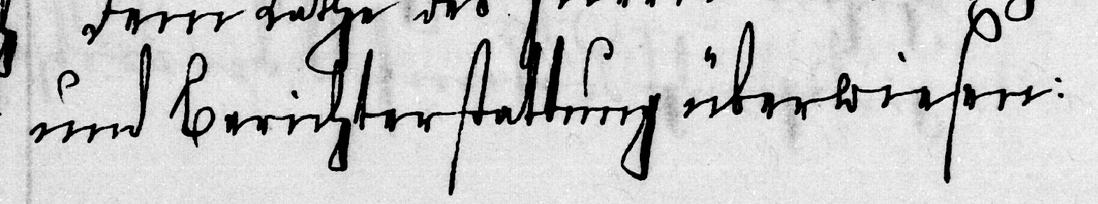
und Berichterstattung überwiesen:
